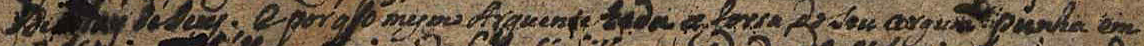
di__ay de Deus. E porq̄ o mesmo Arguente toda a forsa de seu argumto punha em
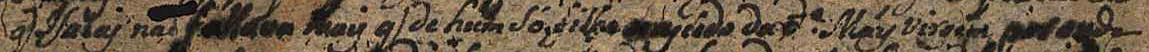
q̄ Isaias naõ fallava mais q̄ de hum só, filho nascido da d̄.a May virgem, por onde
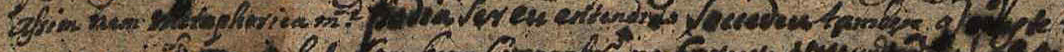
assim nam metaphoricam.te podia ser eu entendido soccedeu tambem q̄ a este
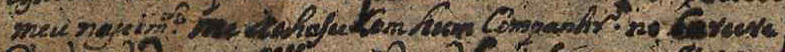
meu nascim.to me achasse Com hum Companhr.o no Carcere
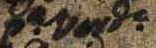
p.a verd.e
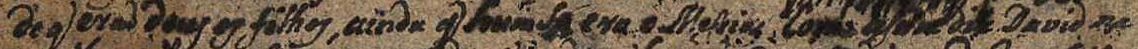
de q̄ eraõ dous os filhos, ainda q̄ hum só era o Messias, como assim diz David na
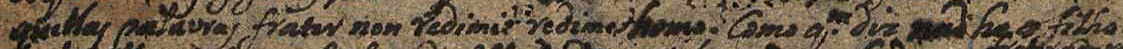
quellas palavras frater non redimir redimet homo; Como q.m diz naõ he o filho
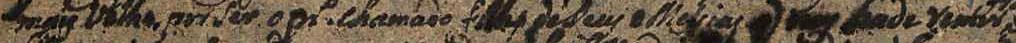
mais Velho, por ser o pr.o chamado filho de Deus o Messias q̄ nos ha de render,
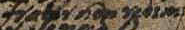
frater non redim
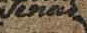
senaõ
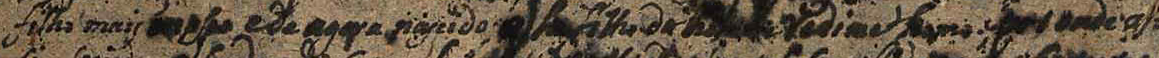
filho mais mosso e de agora nascido, q̄ he filho da hu_ redimet __ e por onde as
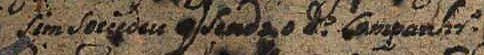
sim soccedeu q̄ sendo o d.o Companhr.o
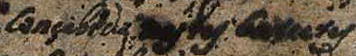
concibida nestes Carceres
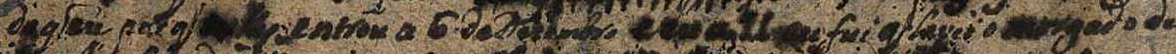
de q̄ eu porq̄ __es entrou a 6. de Dezembro e eu assim fui q̄ lavei o morgado de
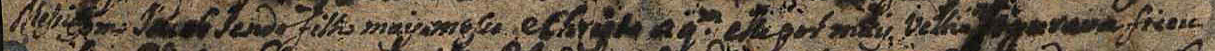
Messias Como Iacob sendo filho mais mosso, e Christo a q.m elle por mais, velho figurava ficou
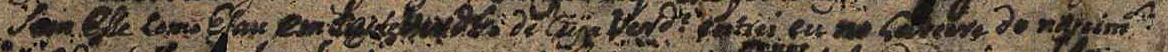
sem elle como Esau, em testemunho de Cuja Verd.e entrei eu no Carcere do nascim.to
